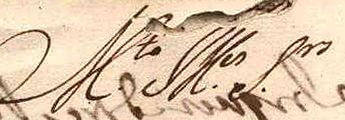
M.to Ill.es S.rs
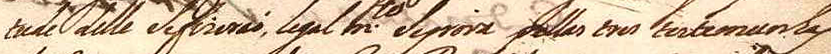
tude delle se fizeraõ, legalm.te se prova pellas tres testemunhas
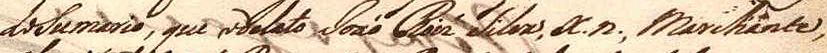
do Sumario, que o delato Ioão Roiz̄ Silaz, x.n., Marchante,
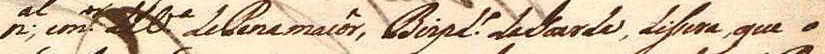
n.al, e m.or da V.a de Panamacôr, Bispd.o da Goarda, dissera, que o
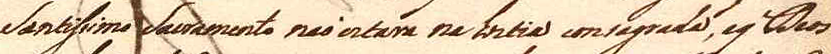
Santissimo Sacramento naõ estava na hostia consagrada, e q̄ Deos
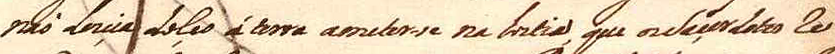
naõ desçia do Çeo á terra a meter-se na hostia, que os Saçerdotes Re
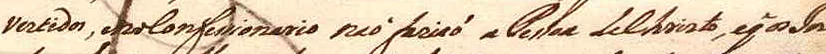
veztidos, e no Confessionario naõ faziaõ a Pessoa de Christo, e q̄ os In
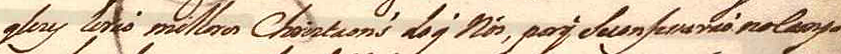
glezes heraõ milhores Christaons̄ do q̄ nós, porq̄ se confessavaõ no Campo
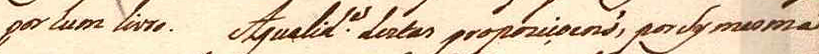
por hum livro. A qualid.e destas propoziçoens̄, por sy mesma
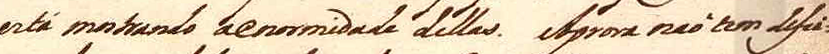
está mostrando a enormidade dellas. A prova naõ tem defei
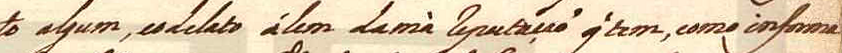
to algum, e o delato álem da mà Reputaçaõ q̄ tem, como informa
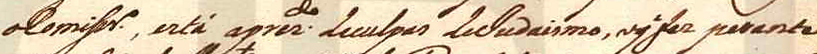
o Comissr.o, eztá aprez.to de culpas de Iudaismo, o q̄ fez perante
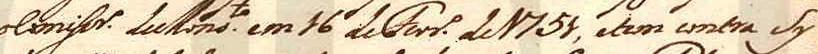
o Comissr.o de Mons.to em 16 de Fevr.o de 1751, e tem contra sy
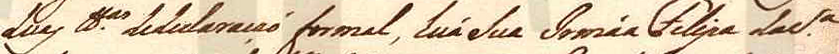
duas tt.as de declaraçaõ formal, huā sua Irmāa Filipa da S.a
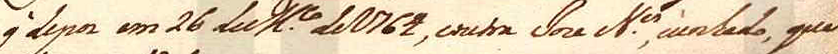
q̄ depoz em 26 de M.co de 1764, e outra Ioze N.es, cunhado, que
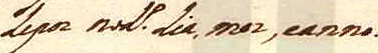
depoz no d.o dia, mez, e anno.
